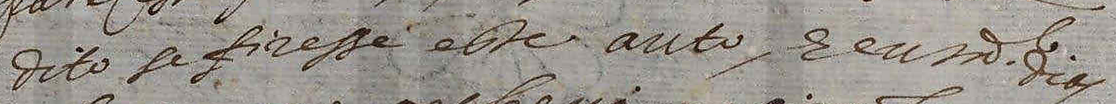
dito se fizesse este auto, E eu m.el dias
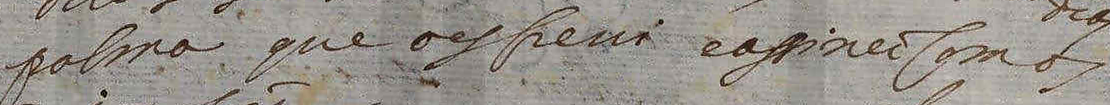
palma, que o esCreui e assinei Com os
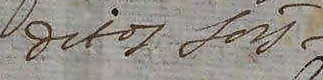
ditos sōrs
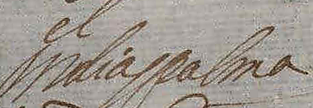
Mel dias palma
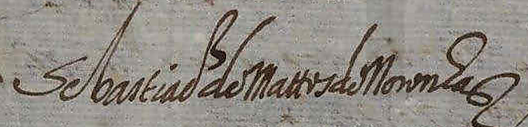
Sebastiaõ de Mattos de Noronha
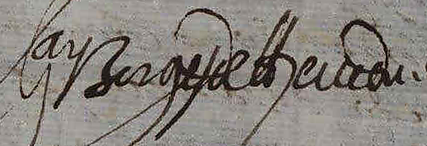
Gar Borges de
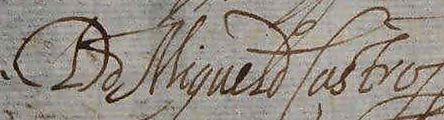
Dō Miguel d Castros
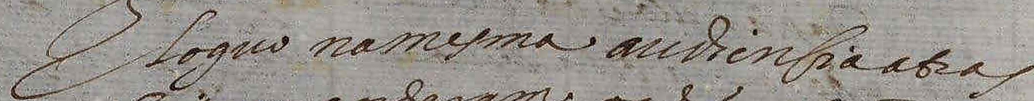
E loguo na mesma audiencia atras
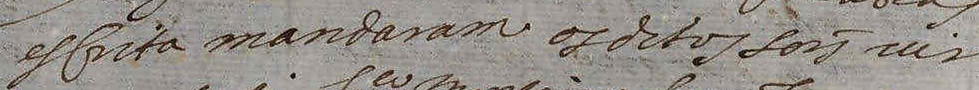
esCrita mandaram os ditos sor̄s uir
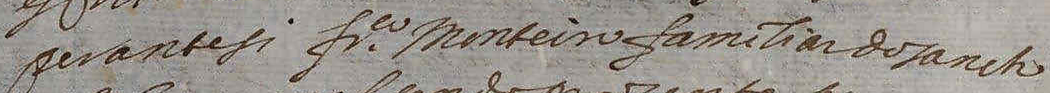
perante si fr.co Monteiro familiar do sancto
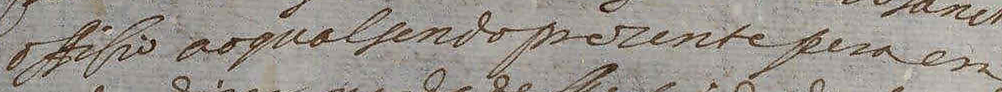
officio ao qual sendo prezente pera em
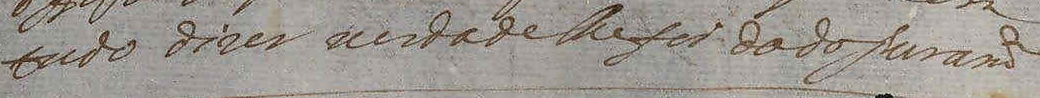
tudo dizer uerdade lhe foi dado juramto
